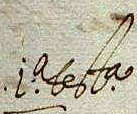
i.a testa.
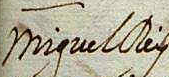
miguel Rey
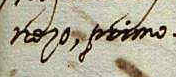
nozo, primo.
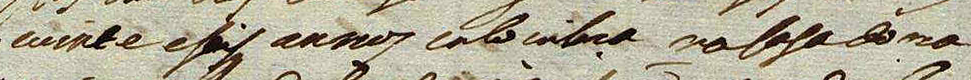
e uinte e seis annos en Coimbra na Casa do ora
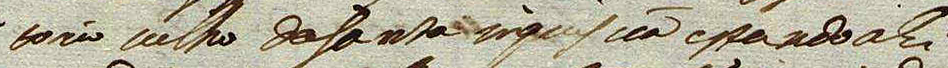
torio uelho da santa inquisiçā estando ahi
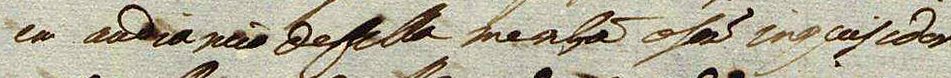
em audiancio de pella menhã o sor̄ inquisidor
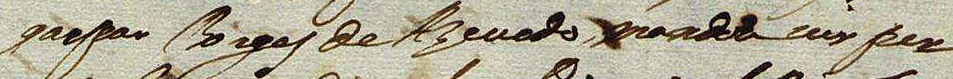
gaspar Borges de Azeuedo, mandou uir per
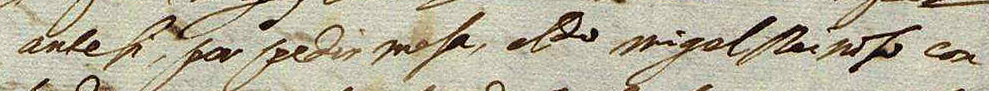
ante si, por pedir mesa, o ldo migel Reinoso con
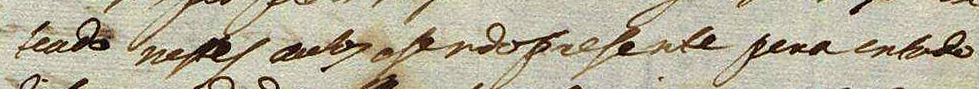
teudo nestes autos e sendo presente pera en tudo
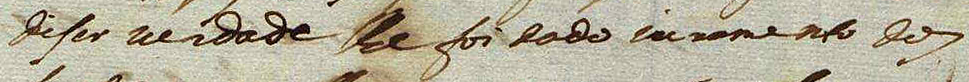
diser uerdade lhe foi dado iuramento dos
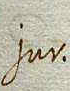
jur.
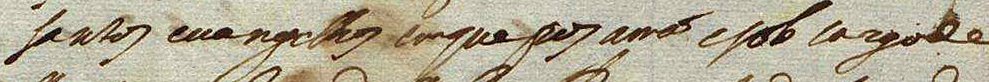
santos euangelhos em que pos a maõ e sob cargo de
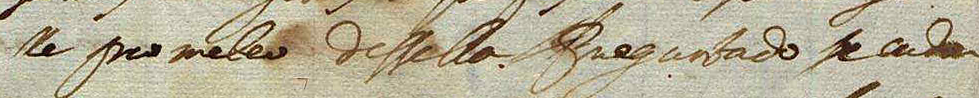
lle prometeo dessella. Preguntado se cudou
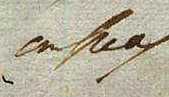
em suas
